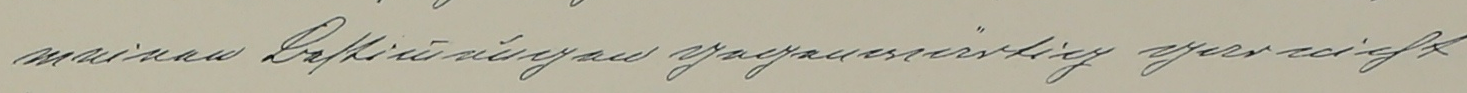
meinen Bestimmungen gegenwärtig gar nicht
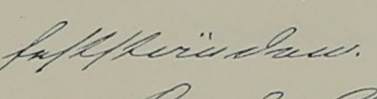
festständen.
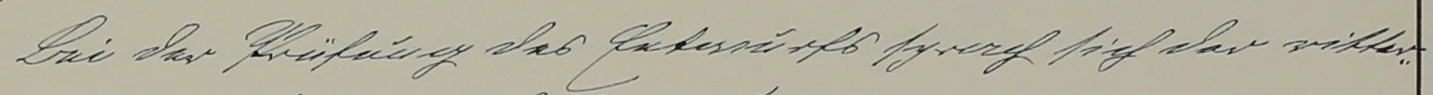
Bei der Prüfung des Entwurfs sprach sich der ritter-
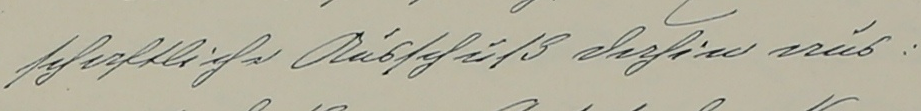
schaftliche Ausschuß dahin aus:
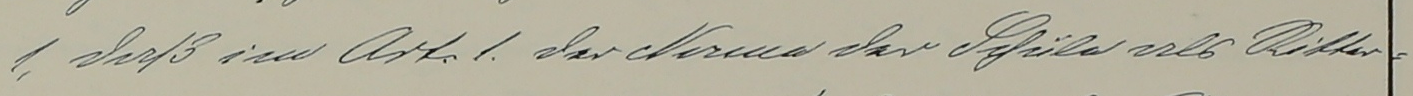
1. daß im Art. 1. der Name der Schule als Ritter-
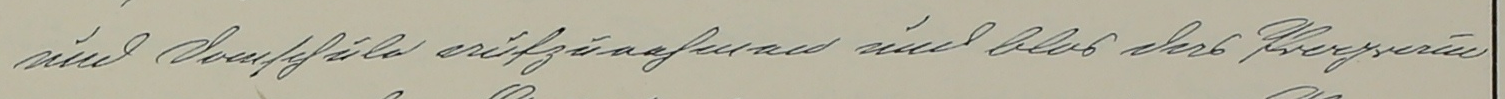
und Domschule aufzunehmen und blos das Programm
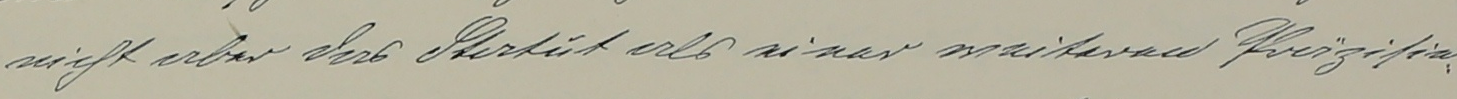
nicht aber das Statut als einer weiteren Präzisie-
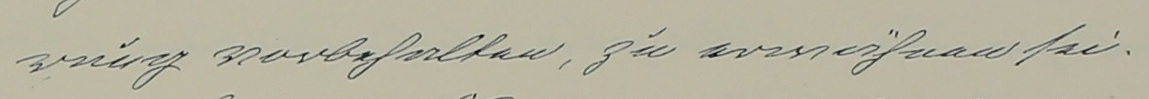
rung vorbehalten, zu erwähnen sei.
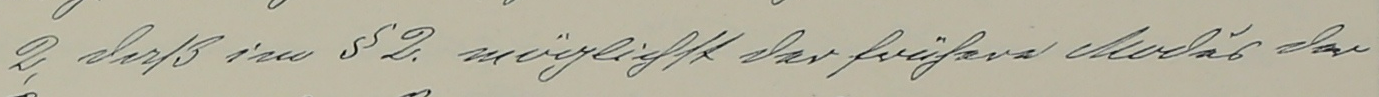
2. daß im §2. möglichst der frühere Modus der
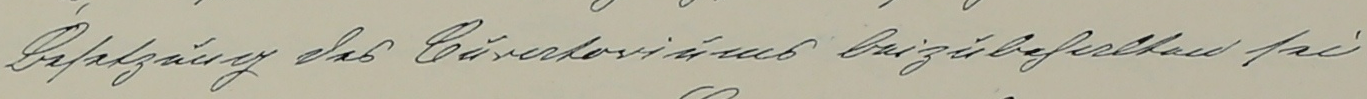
Besetzung des Curatoriums beizubehalten sei.
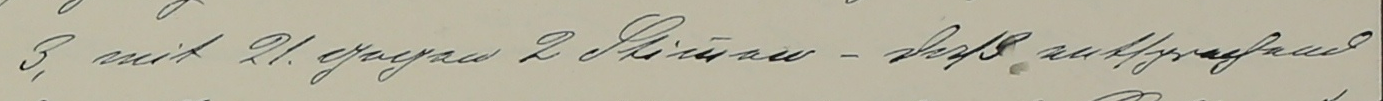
3. mit 21. gegen 2 Stimmen – daß entsprechend
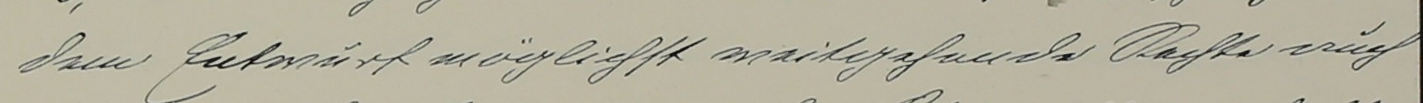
dem Entwurf möglichst weitgehende Rechte auch
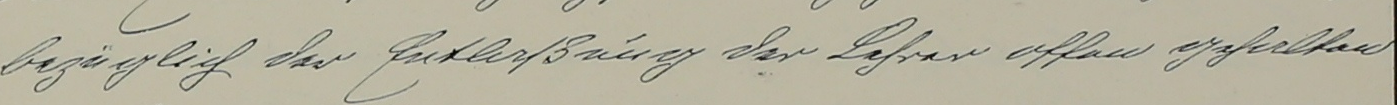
bezüglich der Entlaßung der Lehrer offen gehalten
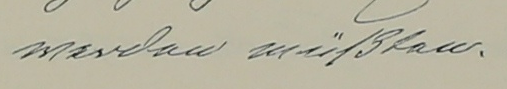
werden müßten.
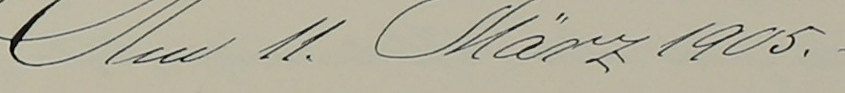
Am 11. März 1905.
